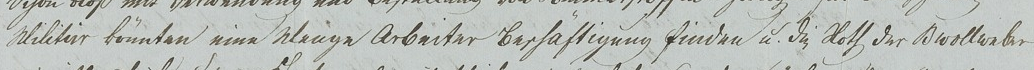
Militär könnten eine Menge Arbeiter Beschäftigung finden u. die Noth der Bwoll weber
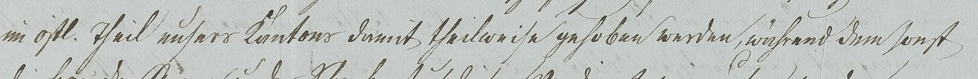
im östl. Theil unsers Kantons damit theilweise gehoben werden, während dem sonst
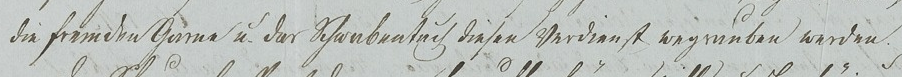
die fremden Garne u. das Schwabentuch diesen Verdienst wegrauben werden.
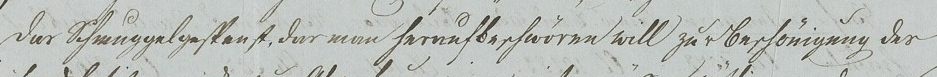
Das Schmuggelgespenst, das man heraufbeschwören will zur Beschönigung des
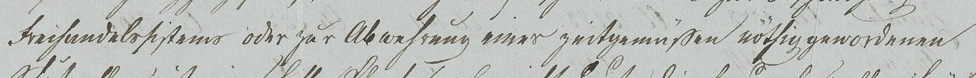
Freihandelssistems oder zur Abwehrung eines zeitgemäßen nöthig gewordenen
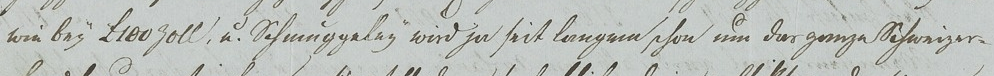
wie bey £ 100 Zoll, u. Schmuggeley wird ja seit langem schon um das ganze Schweizer-
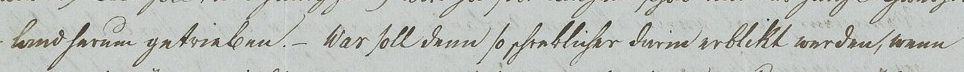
land herum getrieben. – Was soll denn so schrekliches darin erblikt werden, wenn
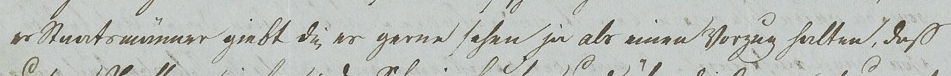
es Staatsmänner giebt die es gerne sehen ja als einen Vorzug halten, daß
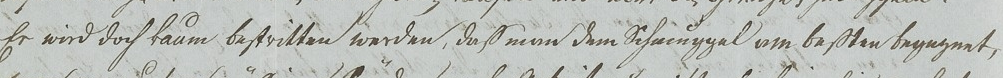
Es wird doch kaum bestritten werden, daß man dem Schmuggel am beßten begegnet,
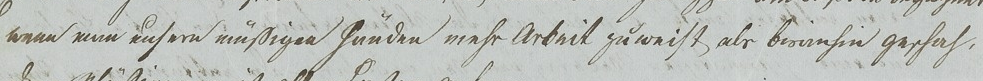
wenn man unsern müßigen Händen mehr Arbeit zuweist als bisanhin geschah,
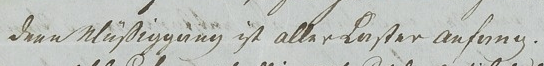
denn Müßiggang ist aller Laster Anfang.
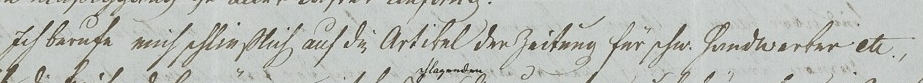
Ich berufe mich schließlich auf die Artikel der Zeitung für schw. Handwerker etc.,
